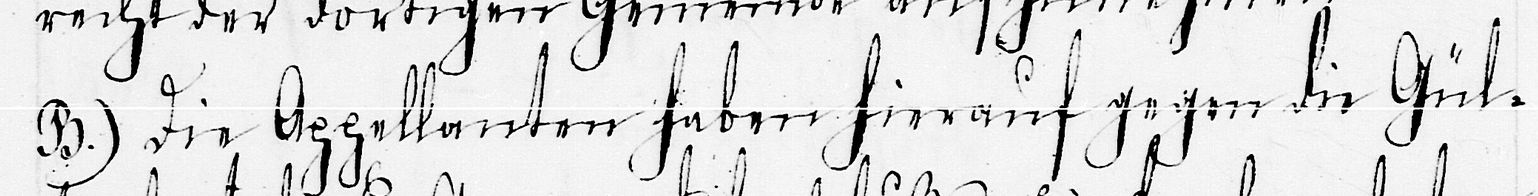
B.) Die Appelanten haben hierauf gegen die Gül¬
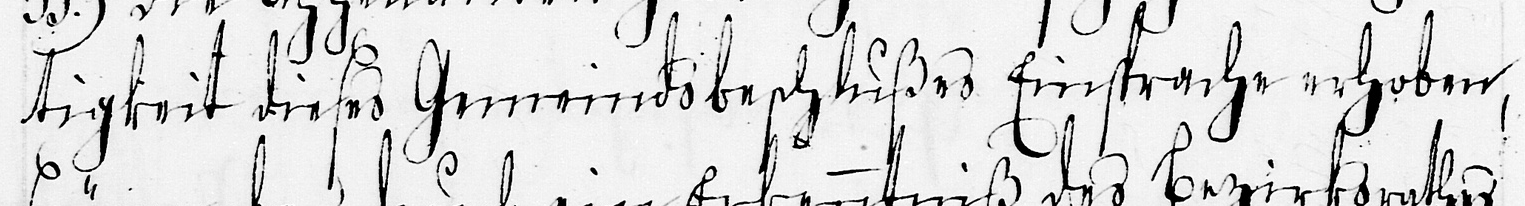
tigkeit dieses Gemeindsbeschlußes Einsprache erhoben,
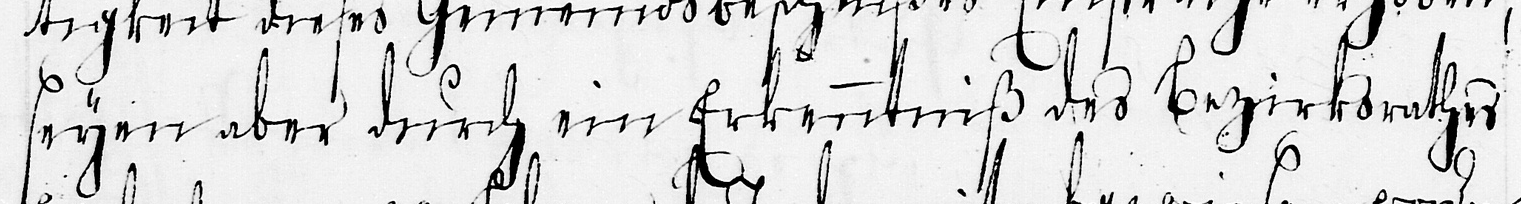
seyen aber durch ein Erkenntniß des Bezirksrathes
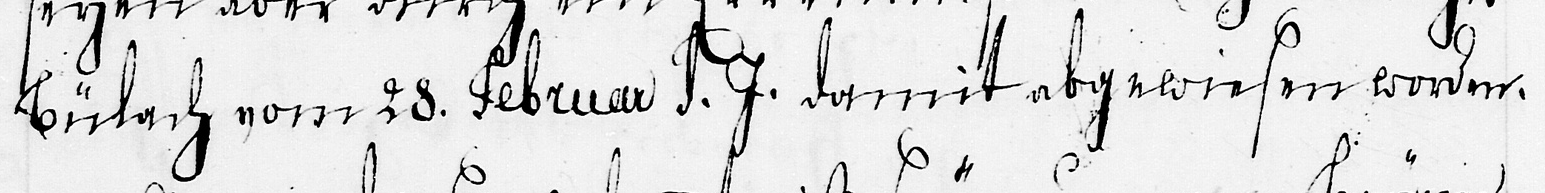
Bülach vom 28. Februar d. J. damit abgewiesen worden.
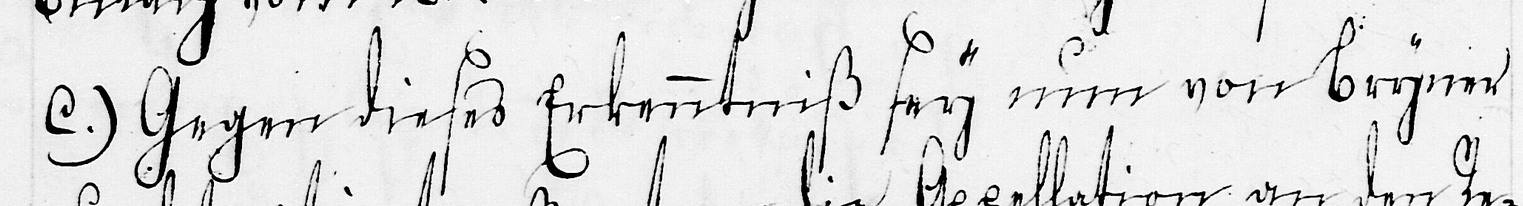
C.) Gegen dieses Erkenntniß sey nun von Bryner
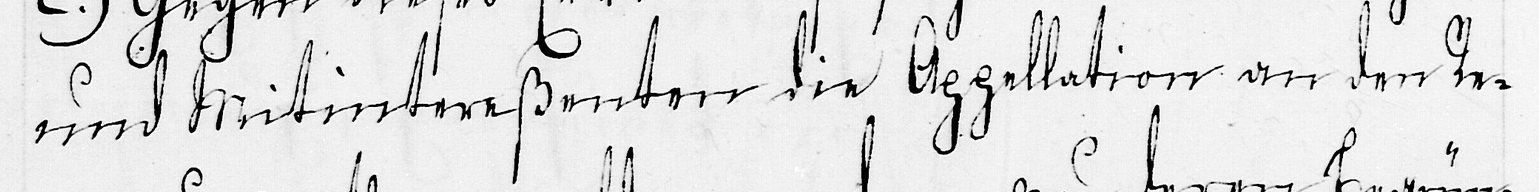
und Mitintereßenten die Appellation an den Re¬
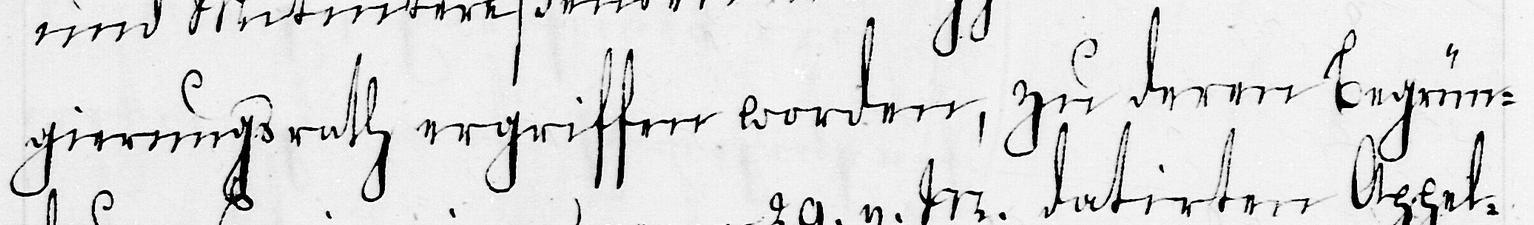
gierungsrath ergriffen worden, zu deren Begrün¬
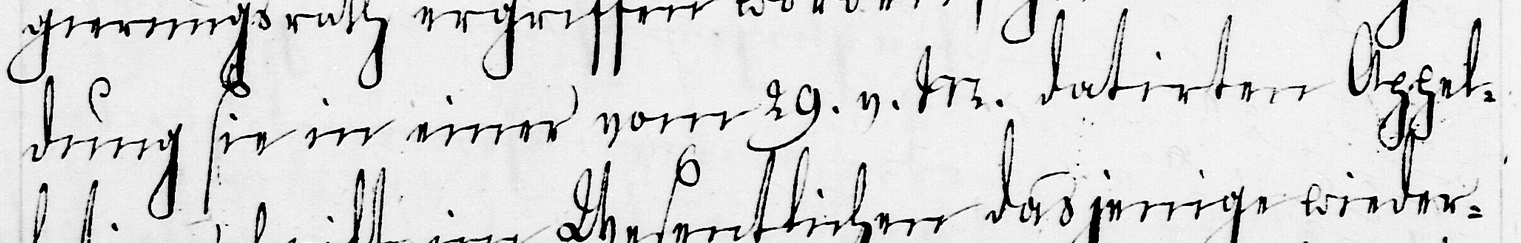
dung sie in einer vom 29. v. M. datirten Appel¬
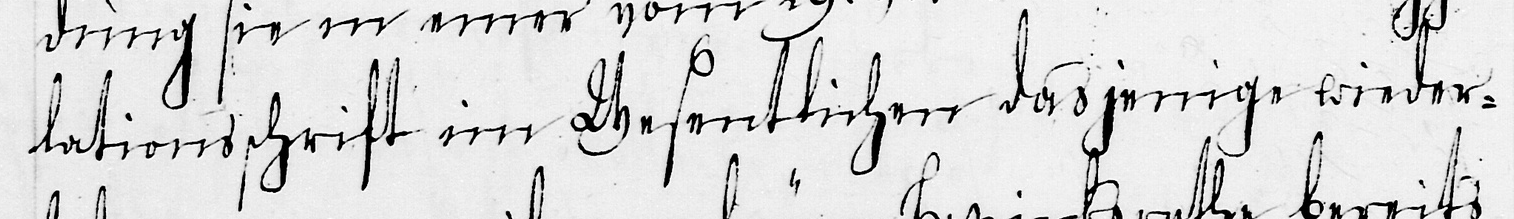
lationsschrift im Wesentlichen dasjenige wieder¬
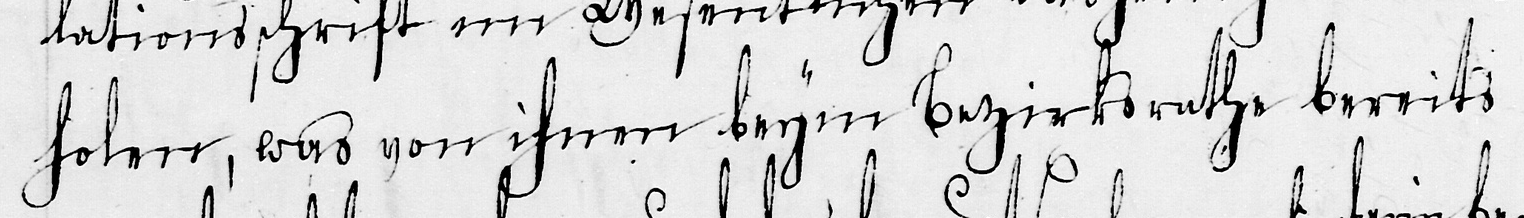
holen, was von ihnen beym Bezirksrathe bereits
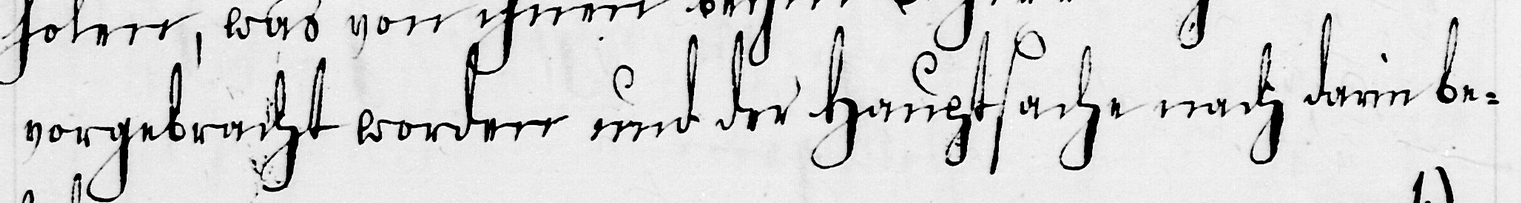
vorgebracht worden und der Hauptsache nach darin be¬
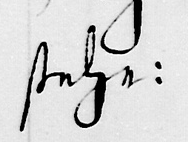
stehe:
